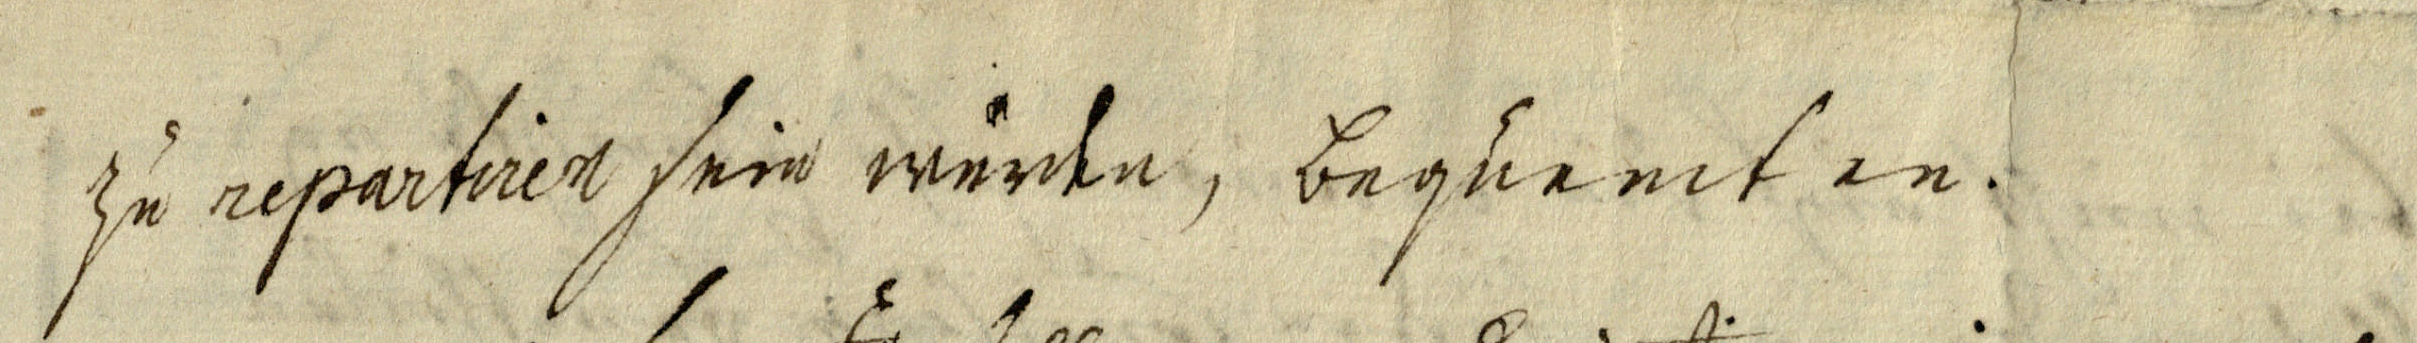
zu repartiren sein würden, bequemten.
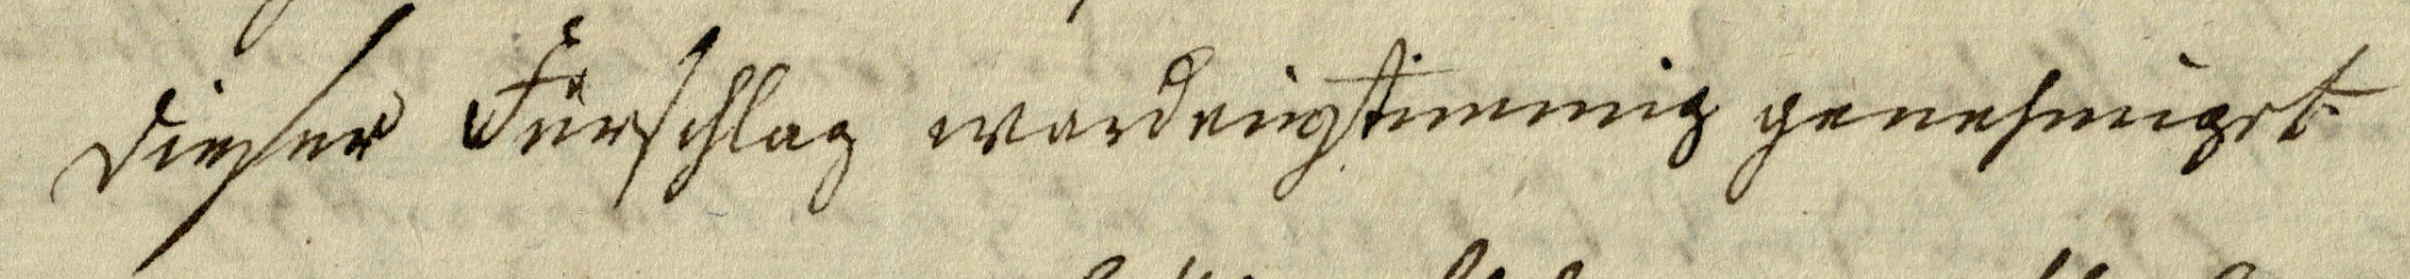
Dieser Fürschlag ward einstimmig genehmiget.
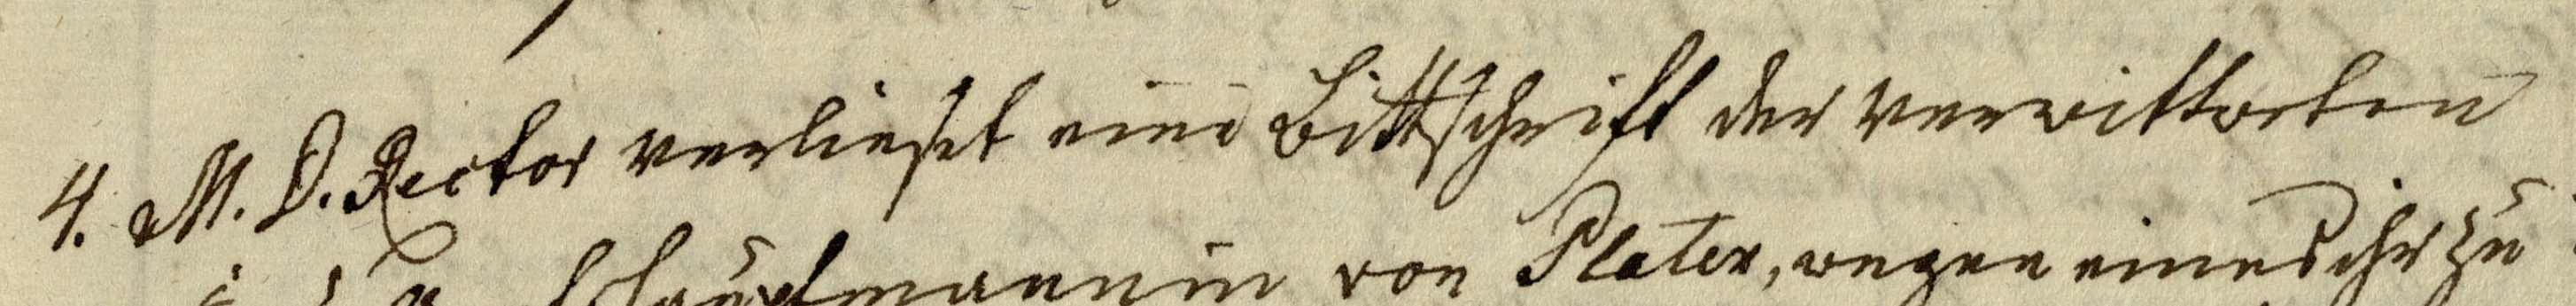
4. M. D. Rector verlieset eine Bittschrift der verwittweten
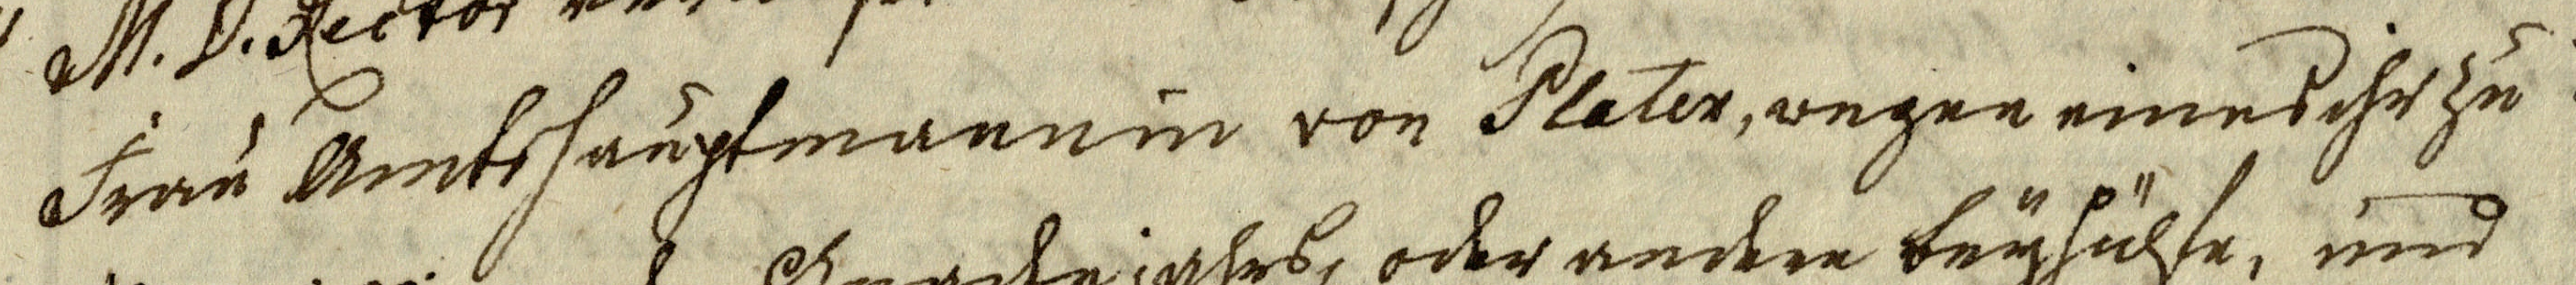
Frau Amtshauptmannin von Platen, wegen eines ihr zu
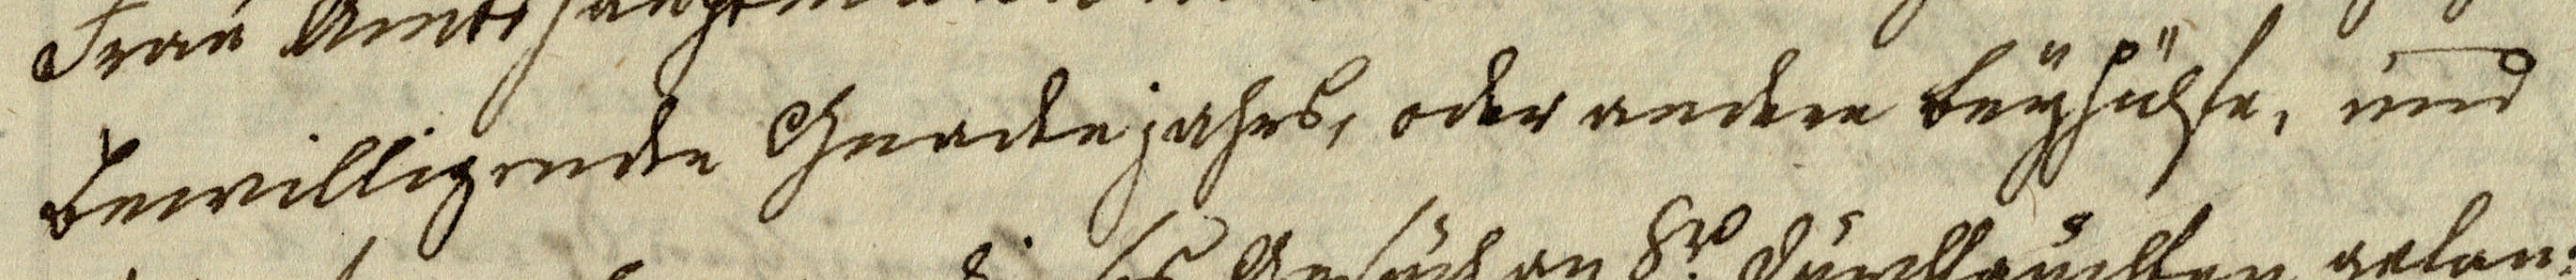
bewilligenden Gnadenjahres, oder andere Beÿhülfe, und
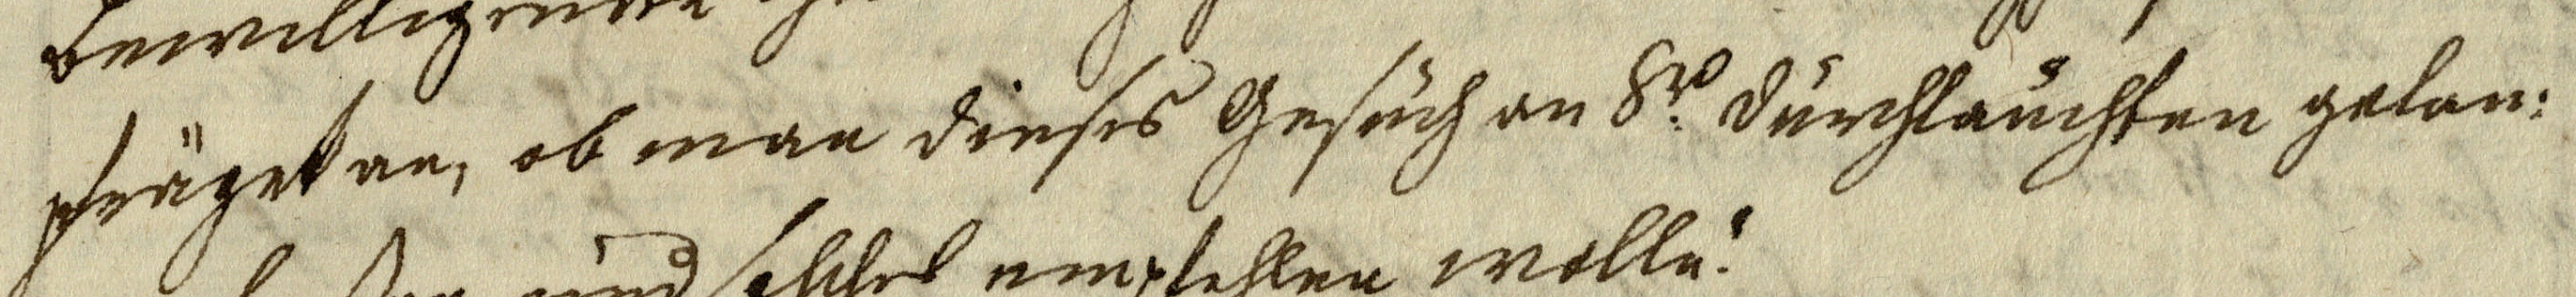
fräget an, ob man dieses Gesuch an Sr. Durchlauchten gelan¬
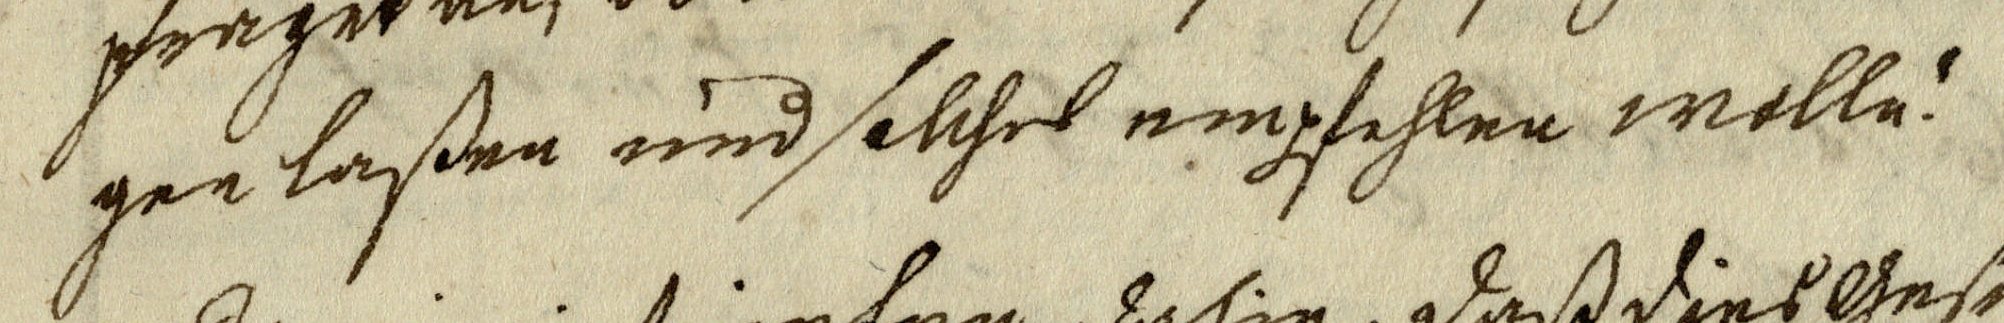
gen laßen und solches empfehlen wolle.
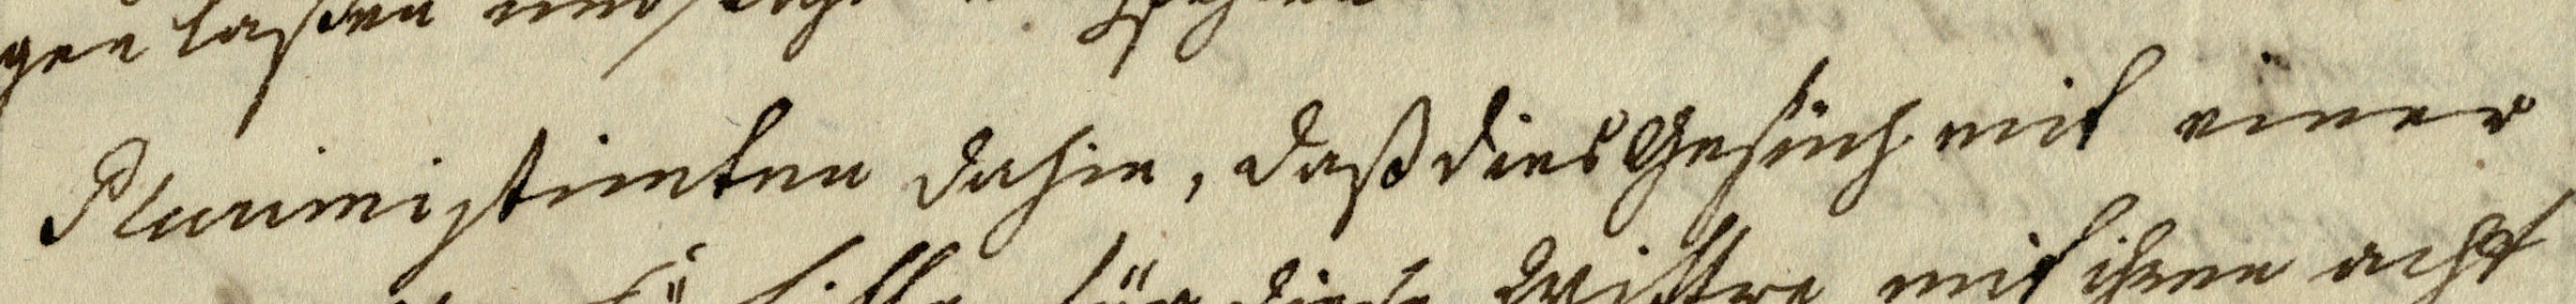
Plurimi stimten dahin, daß dies Gesuch mit einer
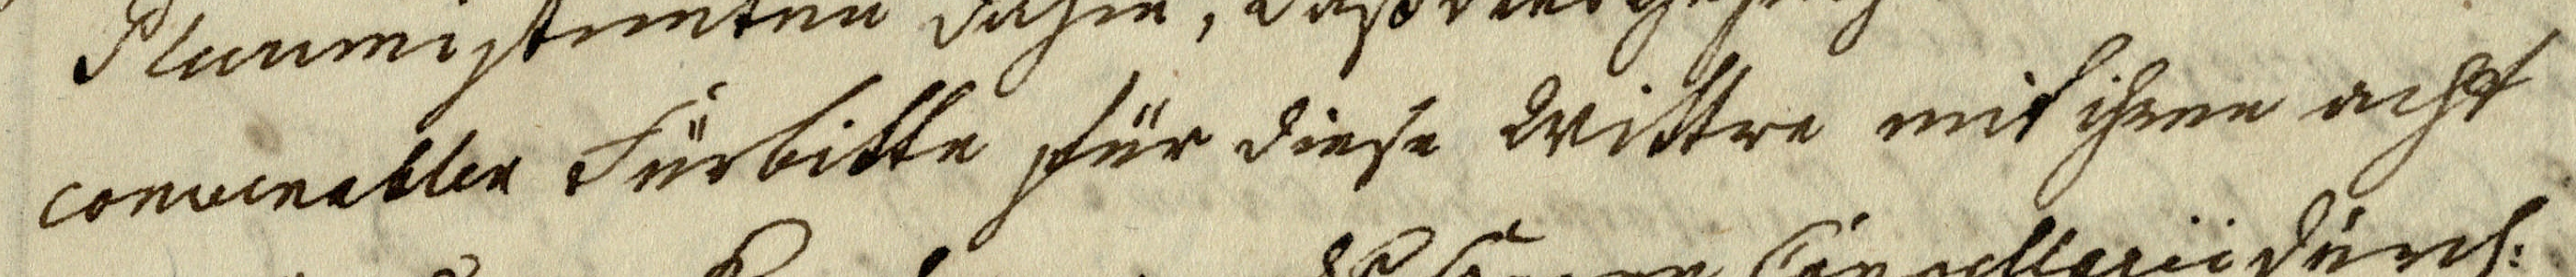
convenablen Fürbitte für diese Wittwe mit ihren acht
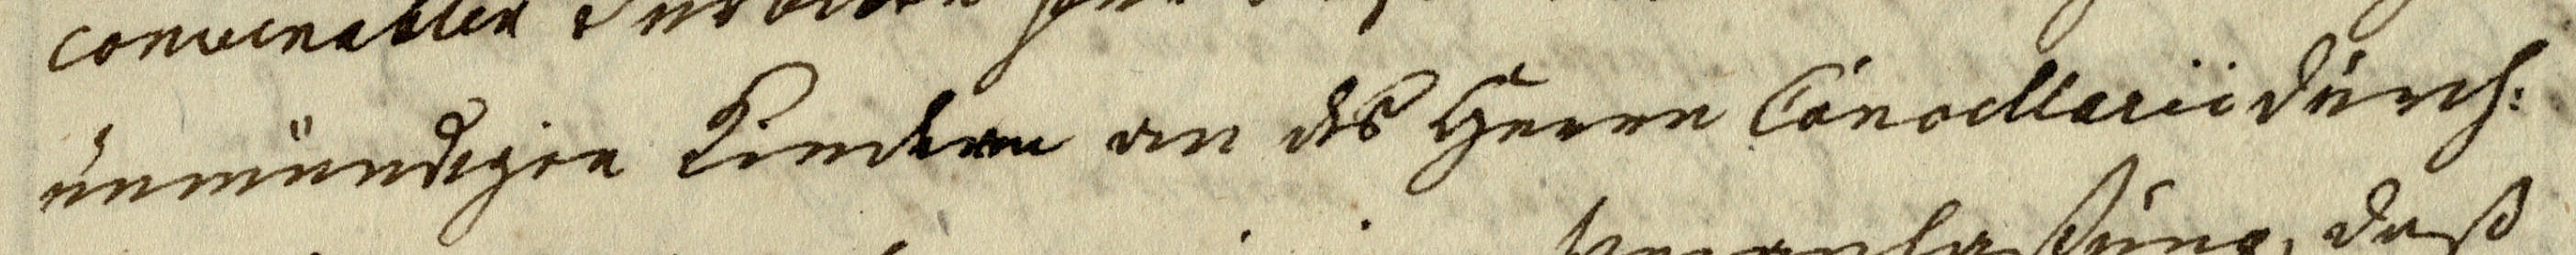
unmündigen Kindern an des Herrn Cancellarii Durch¬
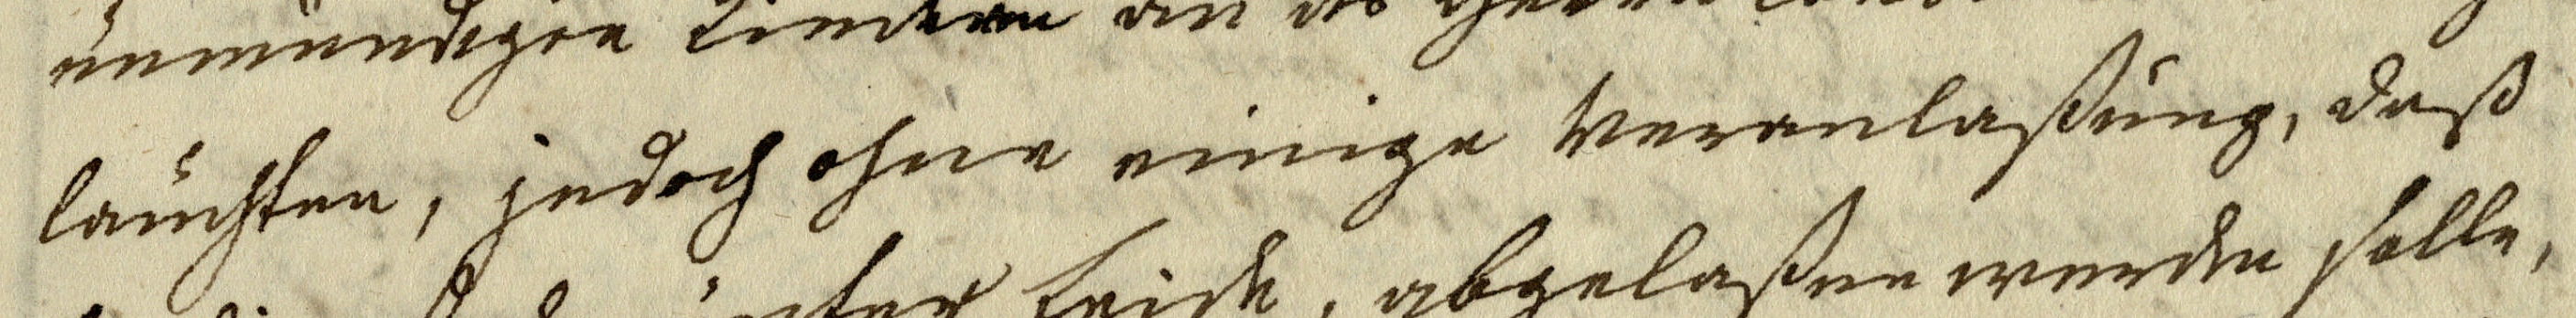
lauchten, jedoch ohne einige Veranlaßung, daß
